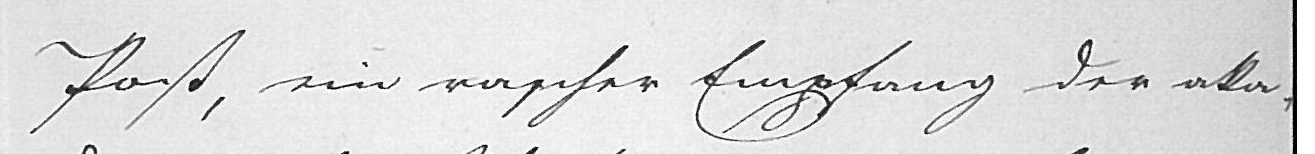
Post, ein rascher Empfang der aka-
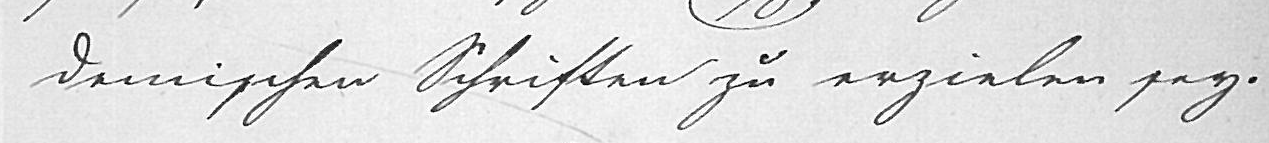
demischen Schriften zu erzielen sey.
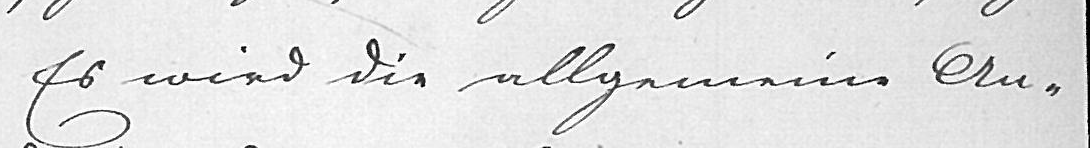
Es wird die allgemeine An-
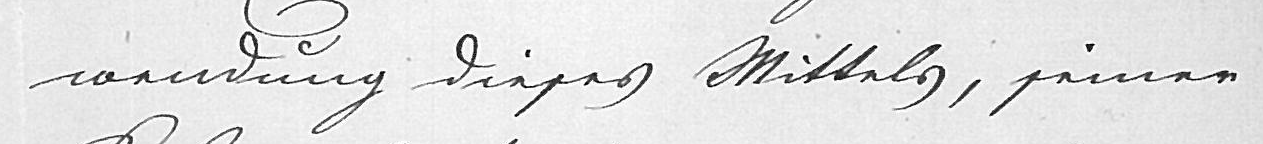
wendung dieses Mittel, seiner
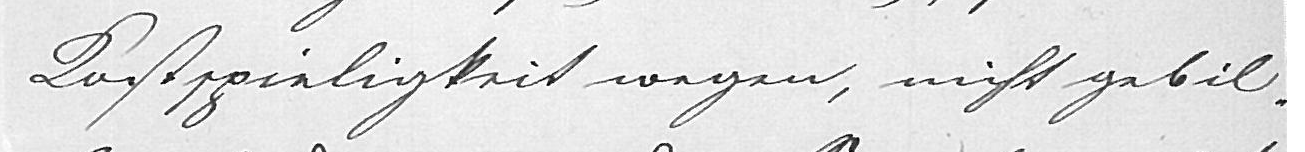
Kostspieligkeit wegen, nicht gebil-
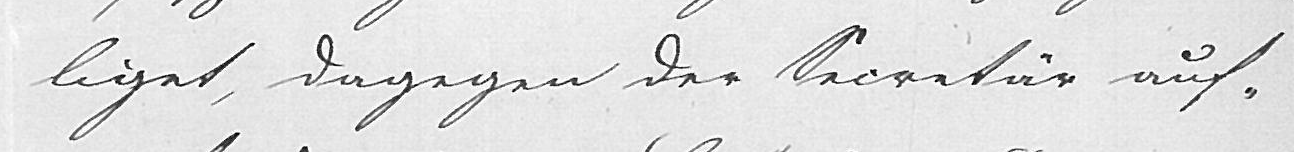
liget, dagegen der Secretär auf-
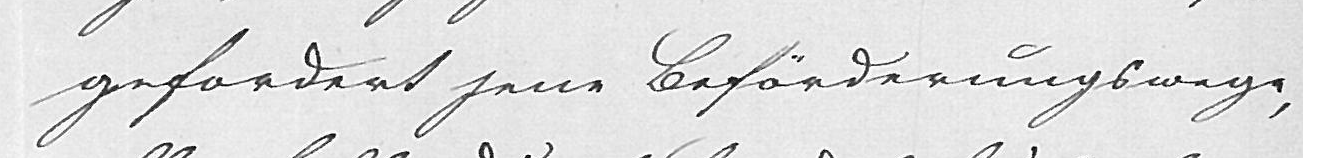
gefordert jene Beförderungswege,
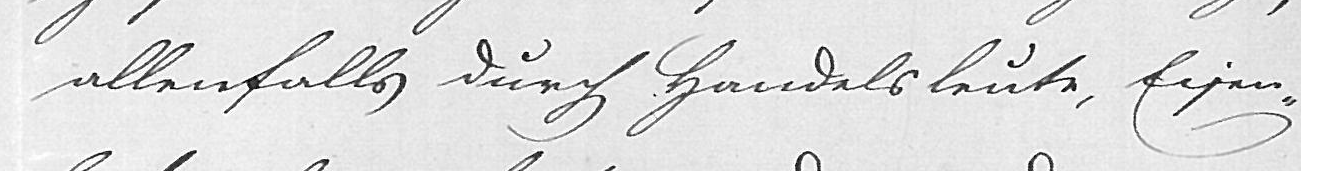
allenfall durch Handelsleute, Eisen-
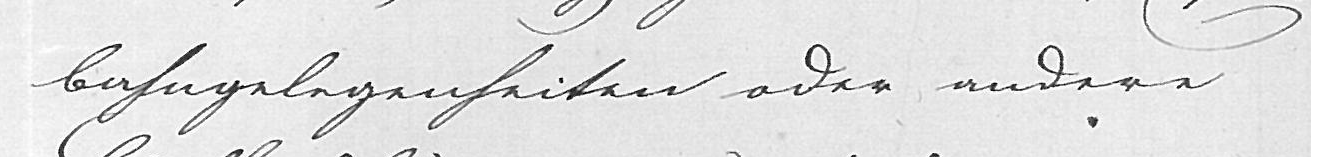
bahngelegenheiten oder andere
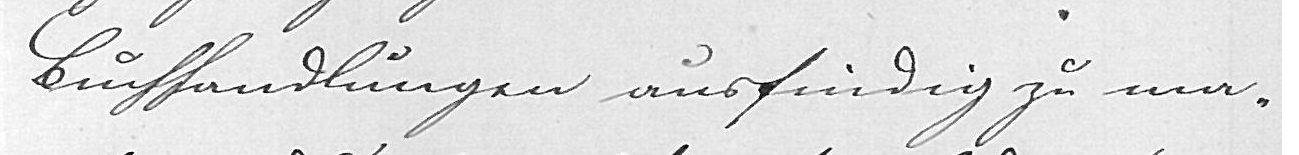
Buchhandlungen ausfindig zu ma-
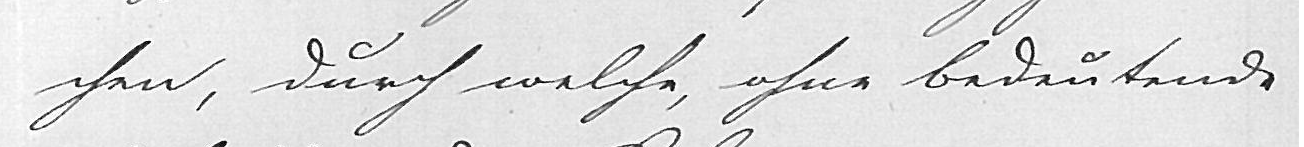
chen, durch welche, ohne bedeutende
